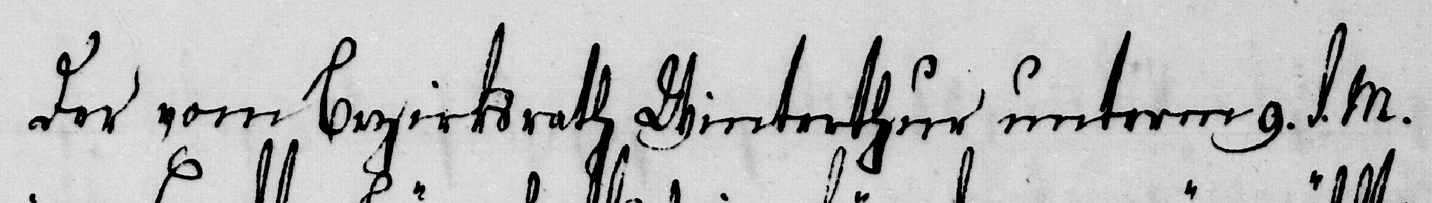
Der vom Bezirksrath Winterthur unterm 9. d. M.
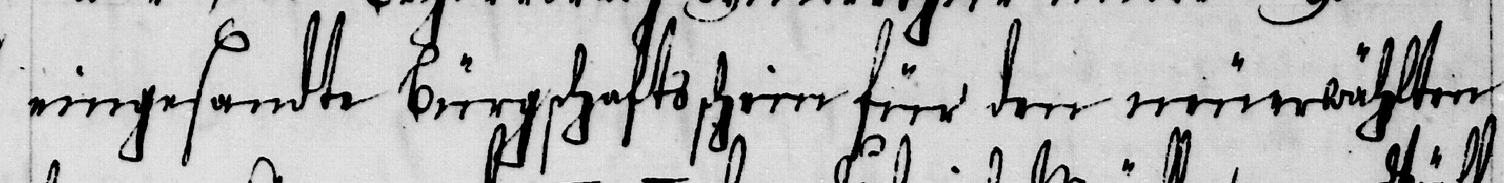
eingesandte Bürgschaftsschein für den neuerwählten
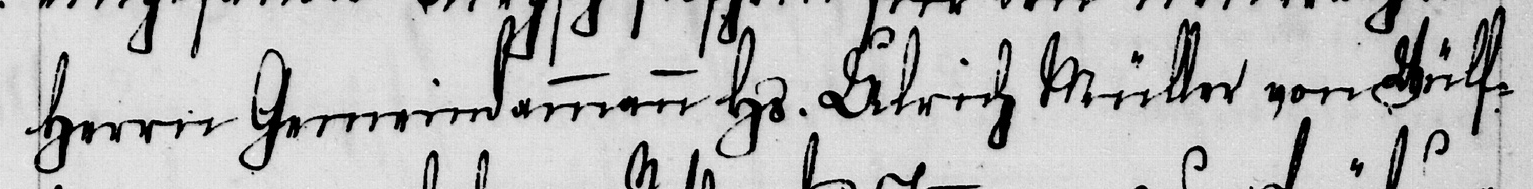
Herren Gemeindammann Hs. Ulrich Müller von Wülf¬
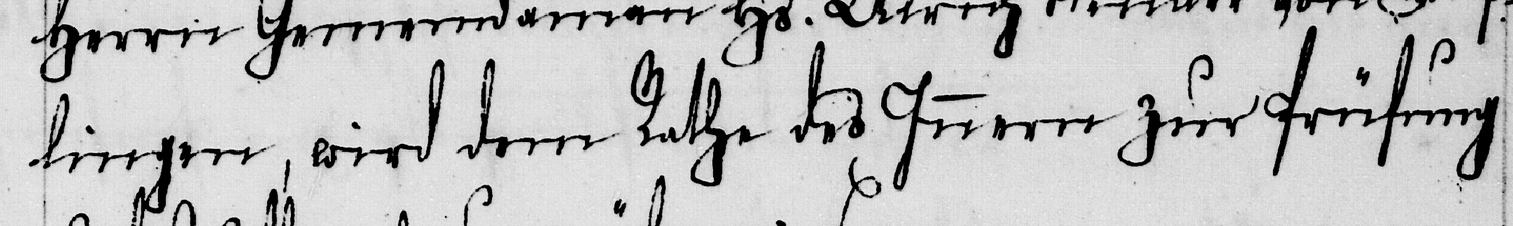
lingen, wird dem Rathe des Innern zur Prüfung
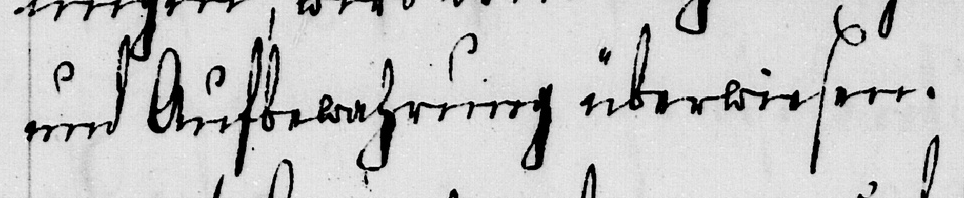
und Aufbewahrung überwiesen.
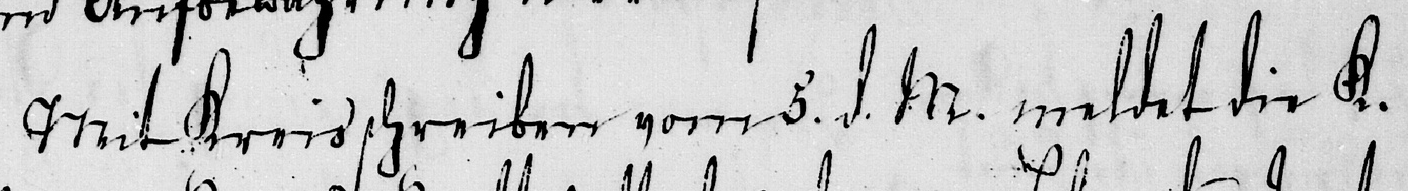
Mit Kreisschreiben vom 5. d. M. meldet die K.
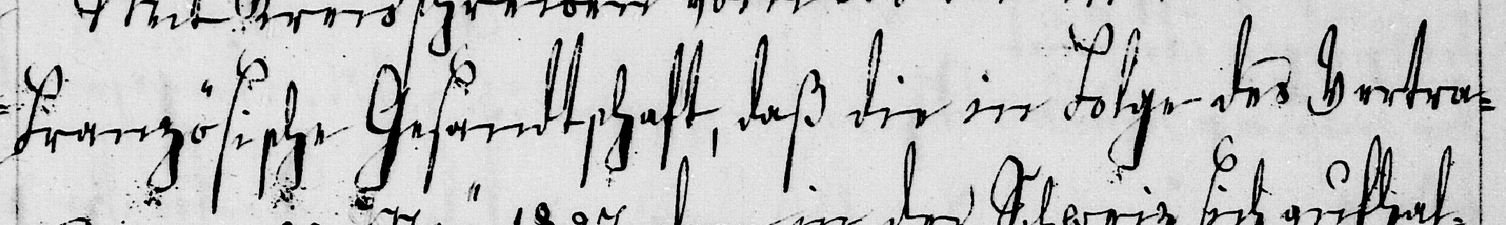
Französische Gesandtschaft, daß die in Folge des Vertra¬
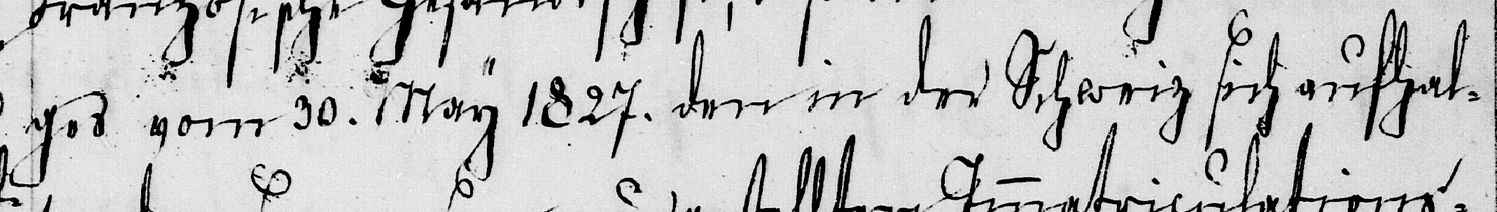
ges vom 30. May 1827. den in der Schweiz sich aufhal¬
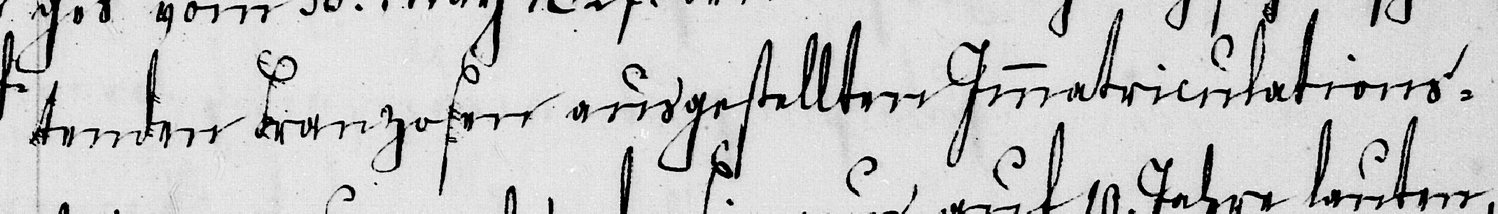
tenden Franzosen ausgestellten Immatriculations¬
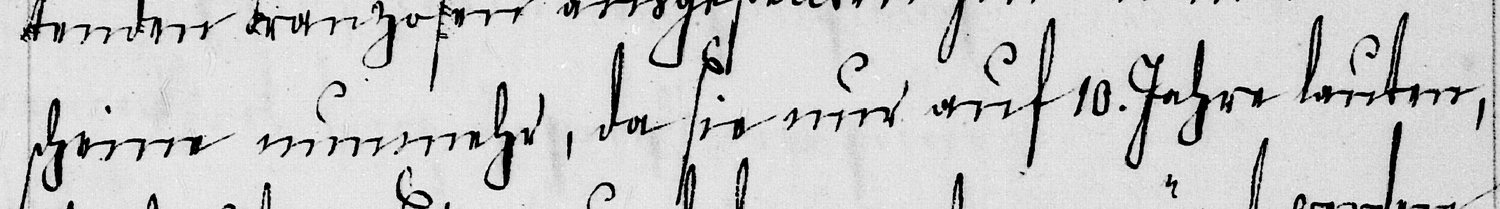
scheine nunmehr, da sie nur auf 10. Jahre lauten,
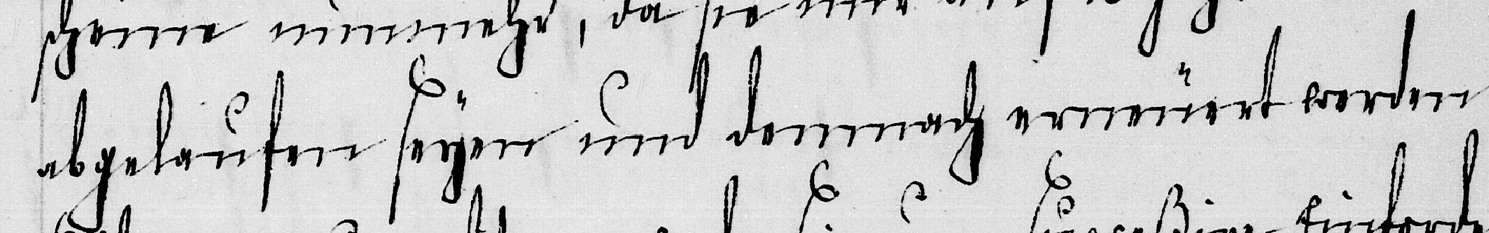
abgelaufen seyen und demnach erneuert werden
